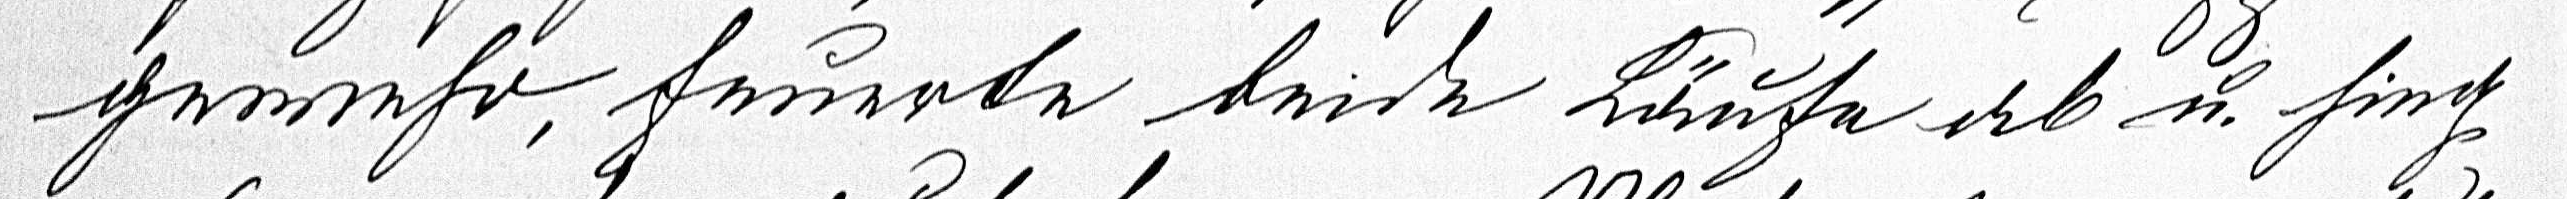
gewehr, feuerte beide Läufe ab u. hing
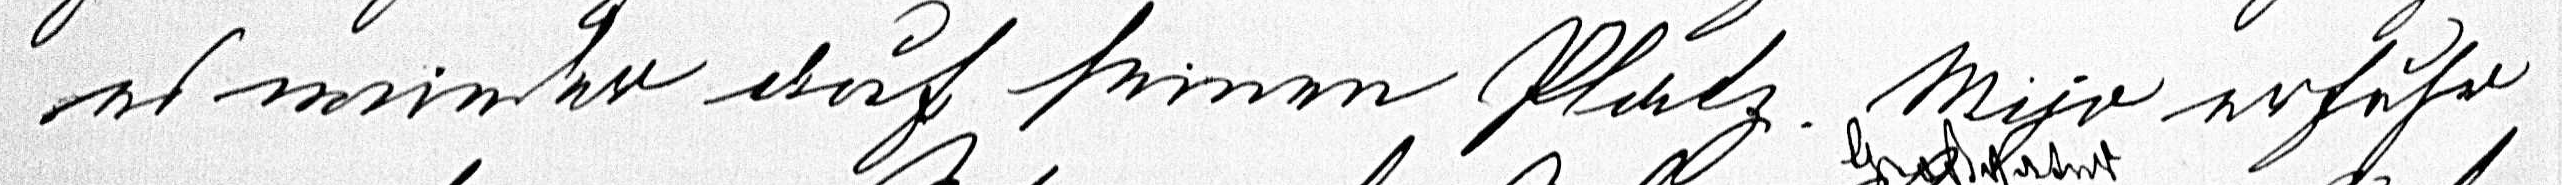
es wieder auf seinen Platz. Mijo erfuhr
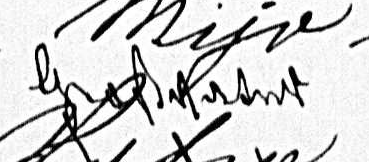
Großvater
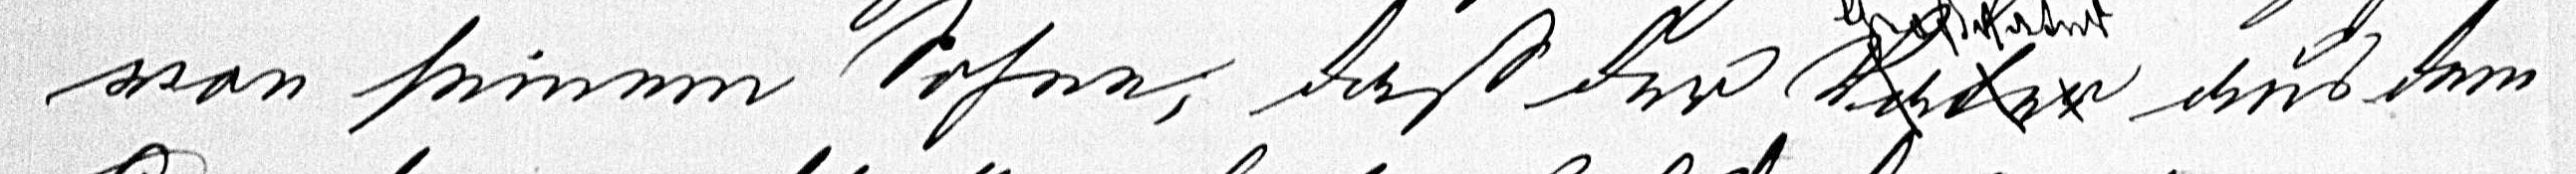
von seinem Sohne, daß der aus dem
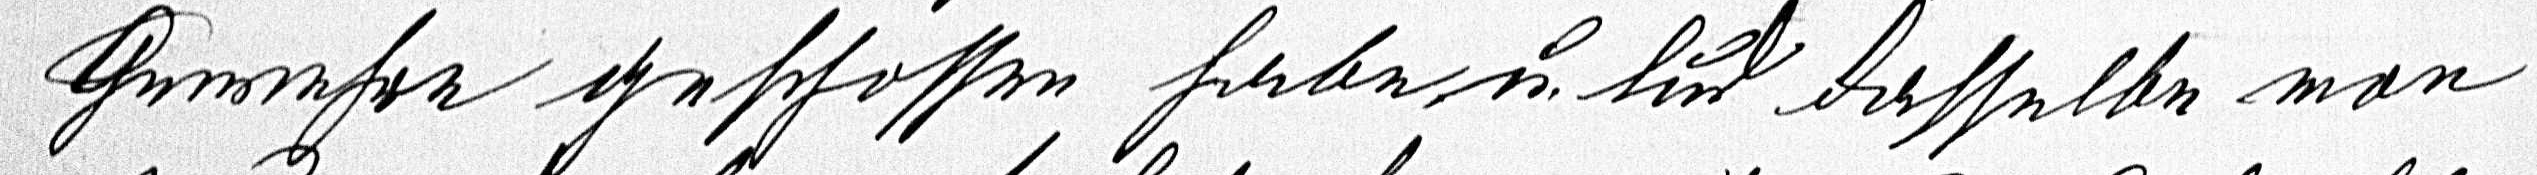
Gewehre geschossen habe, u. lud dasselbe von
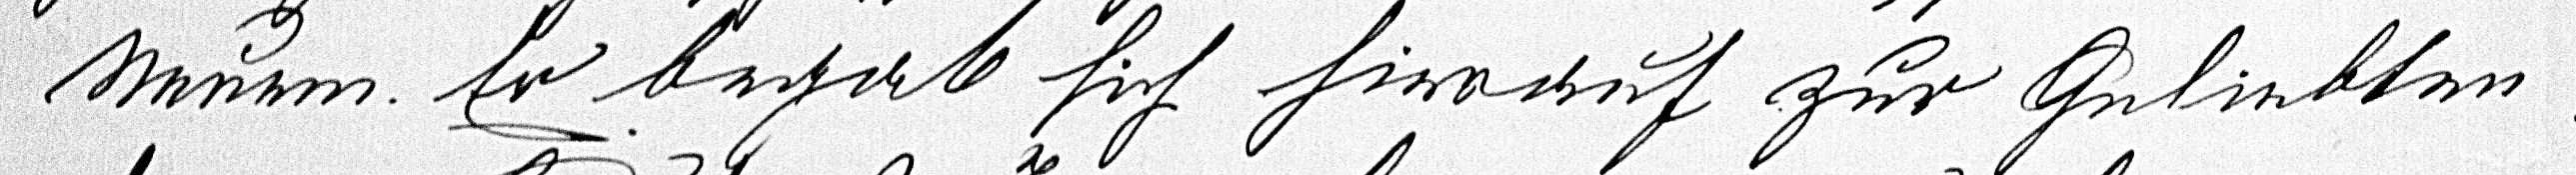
neuem. Er begab sich hierauf zur Geliebten
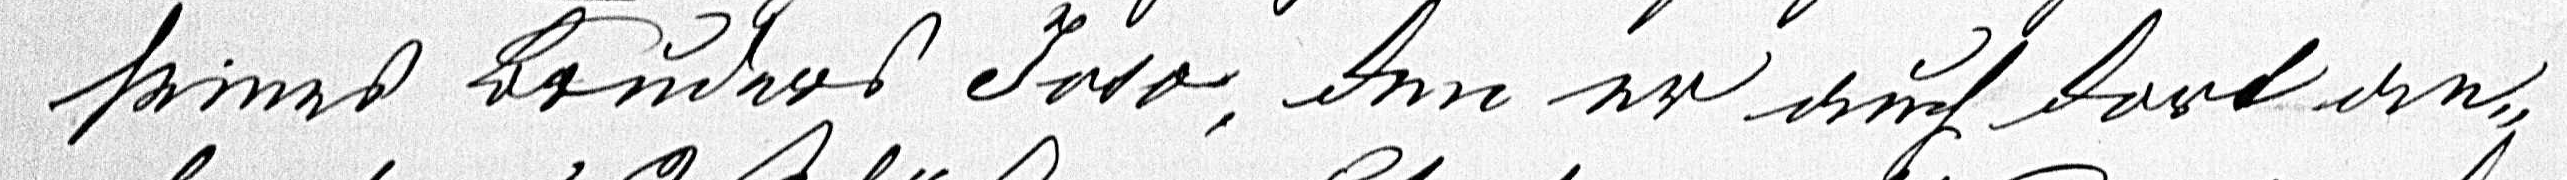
seines Bruders Joso, den er auch dort an¬
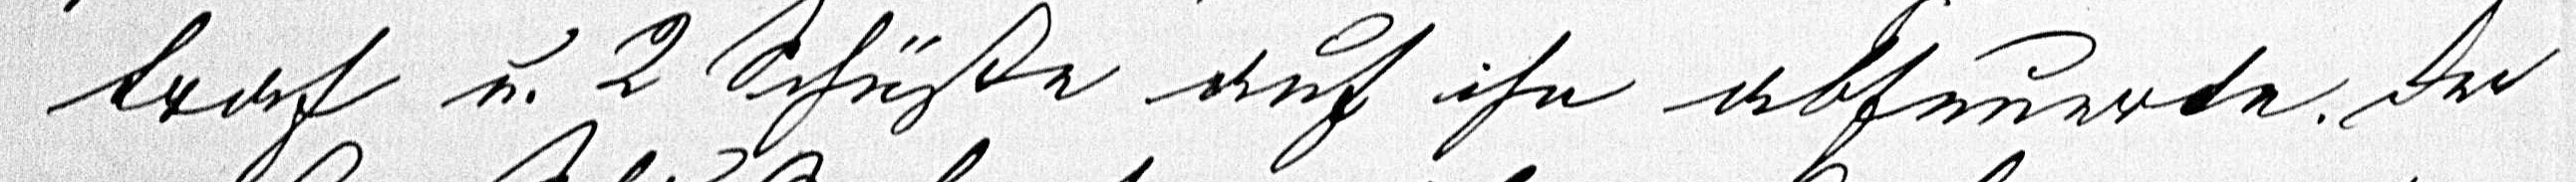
traf u. 2 Schüße auf ihn abfeuerte. Der
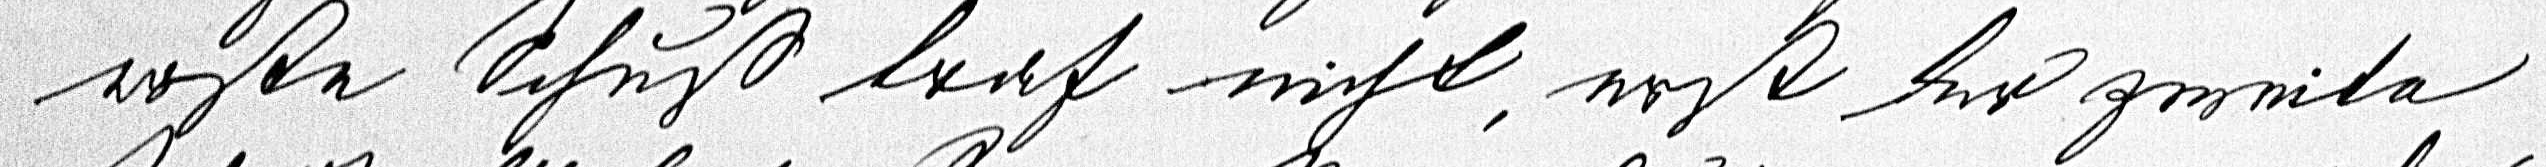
erste Schuß traf nicht, erst der zweite
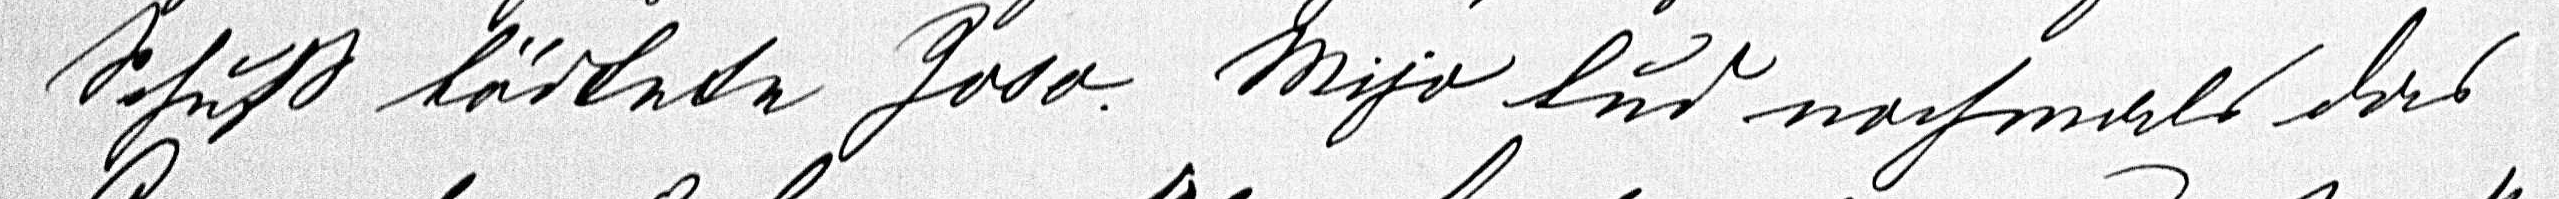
Schuß tödtete Joso. Mijo lud nachmals das
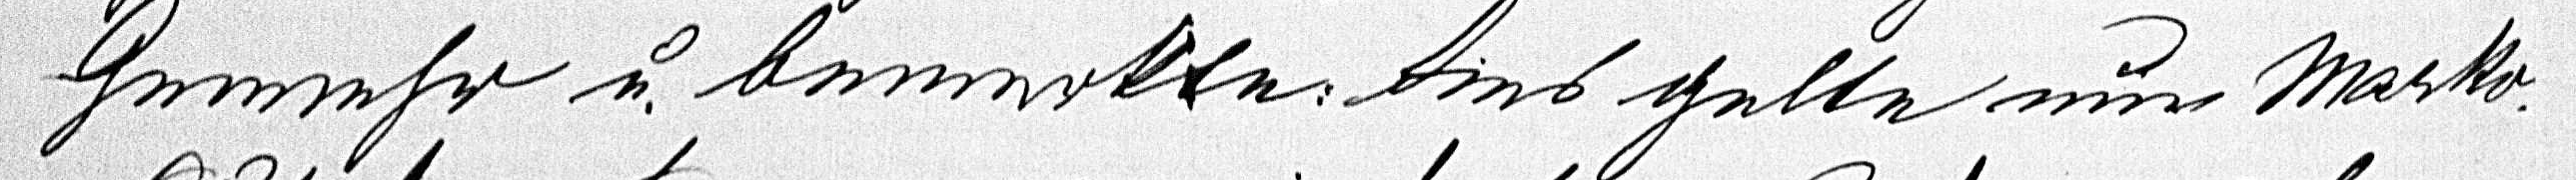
Gewehr u. bemerkte, dies gelte nun Marko.
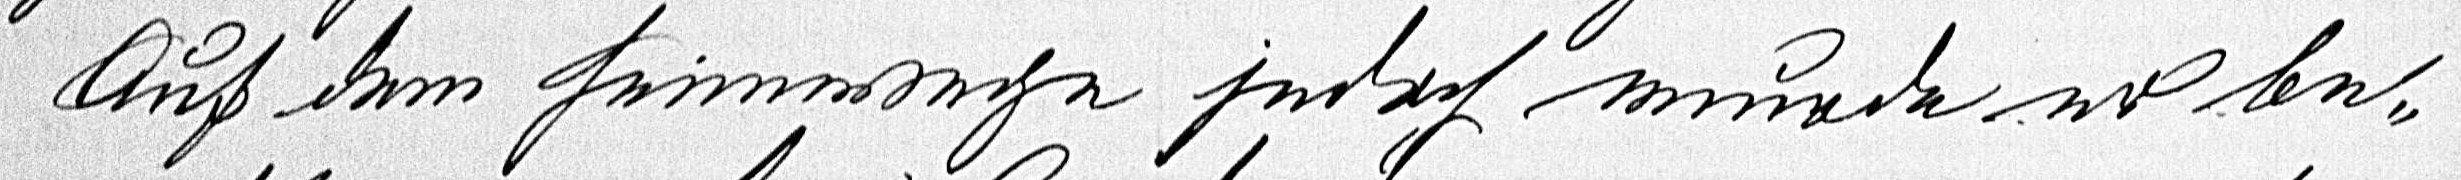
Auf dem Heimwege jedoch wurde er be¬
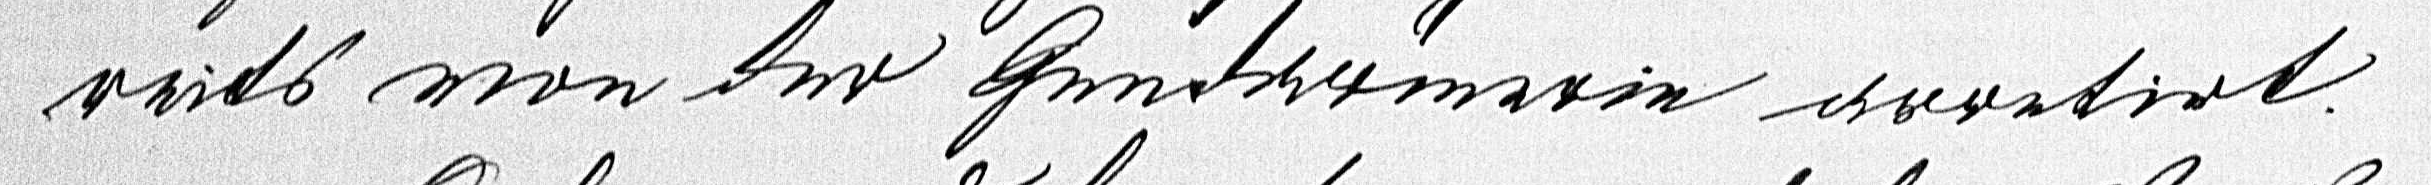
reits von der Gendarmerie arretirt.
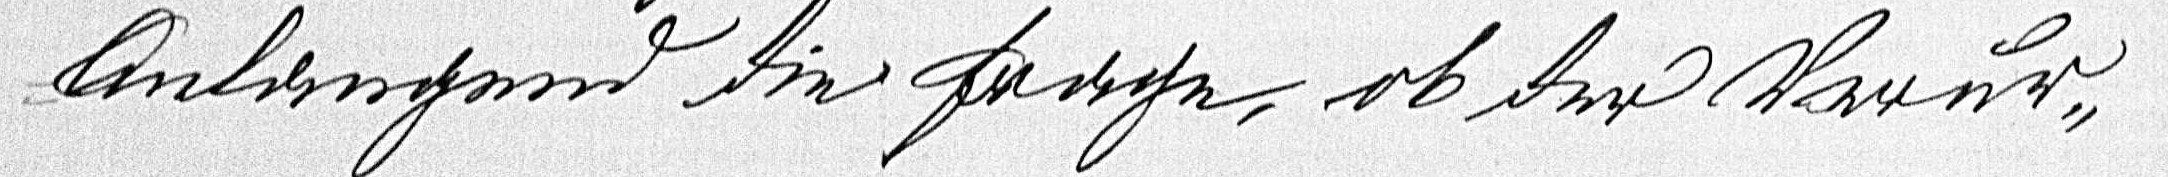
Anlangend die Frage, ob der Verur¬
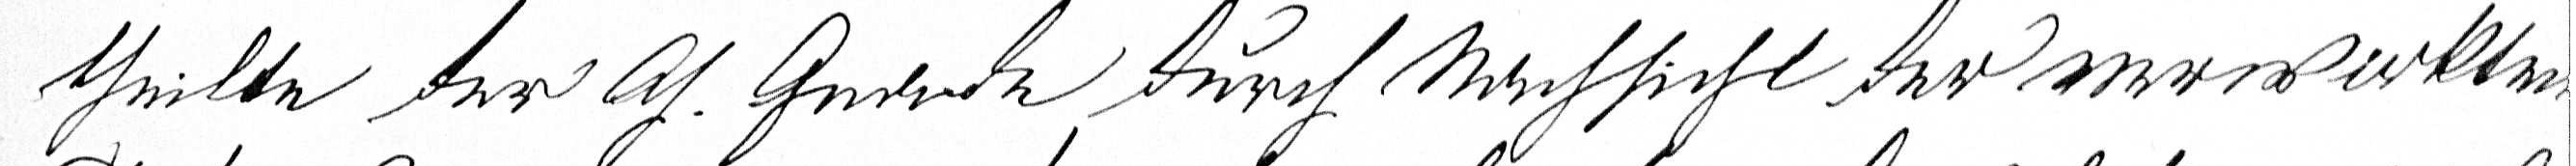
theilte der Ah. Gnade durch Nachsicht der verwirkten
